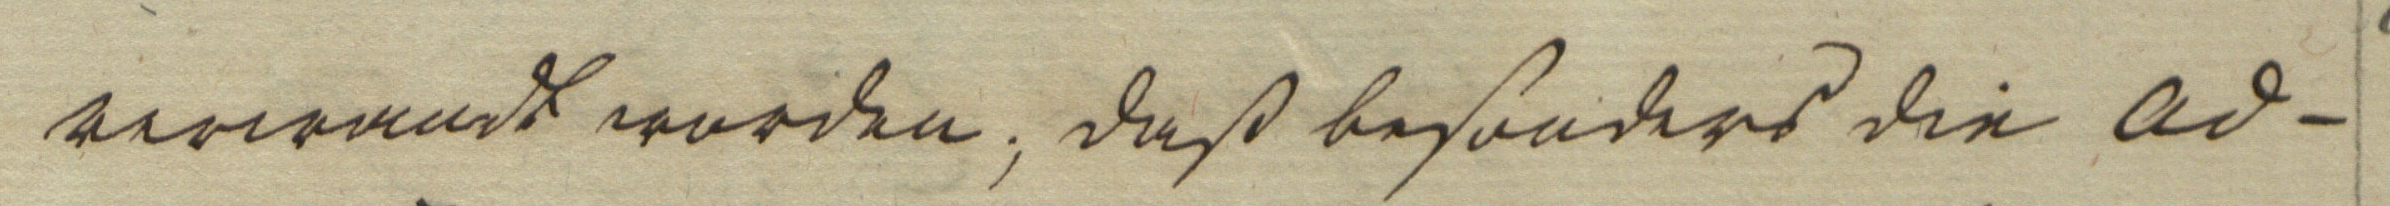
verwandt worden, daß besonders die Ad¬
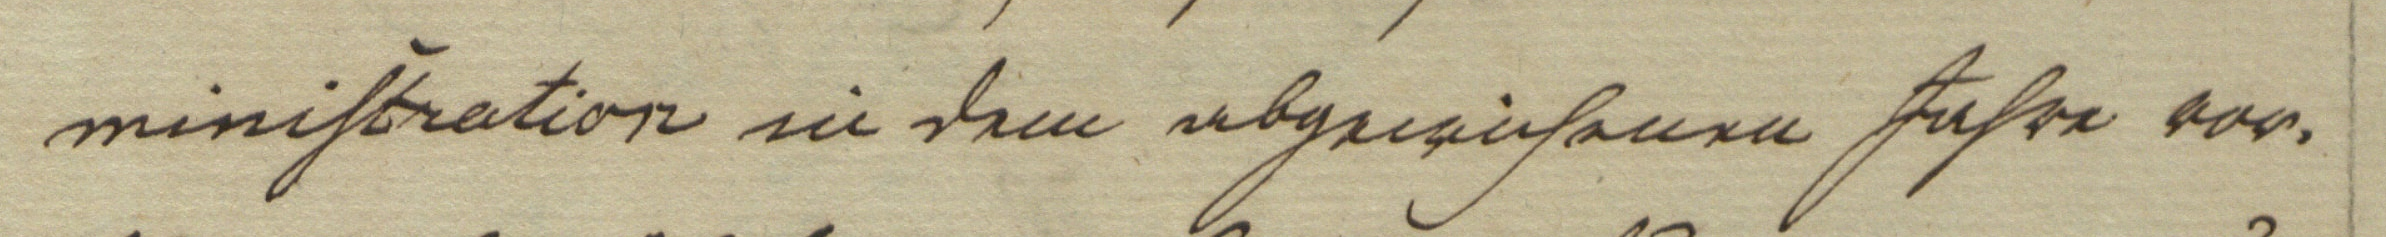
ministration in dem abgewichenen Jahre vor¬
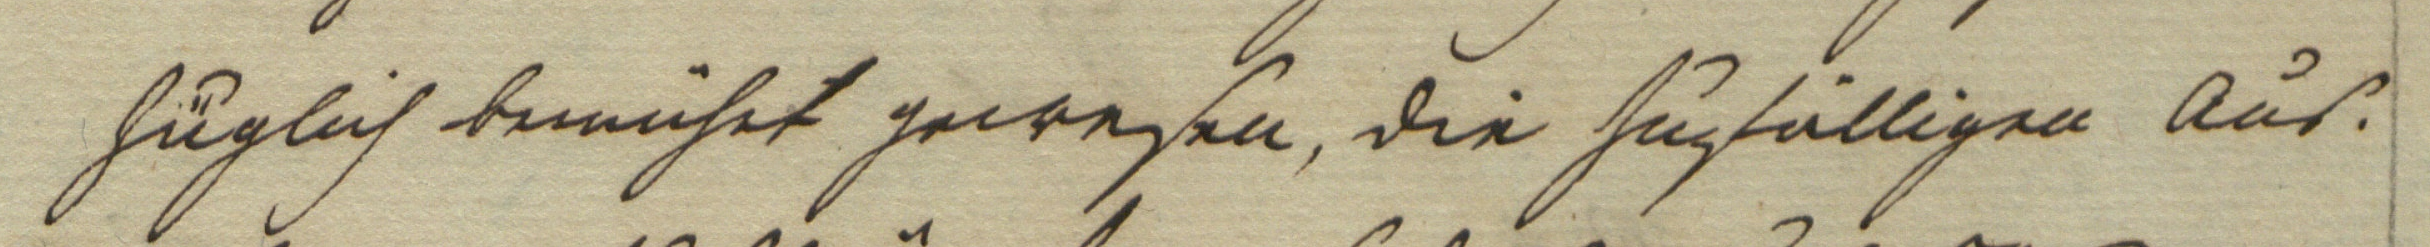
züglich bemühet gewesen, die zufälligen Aus¬
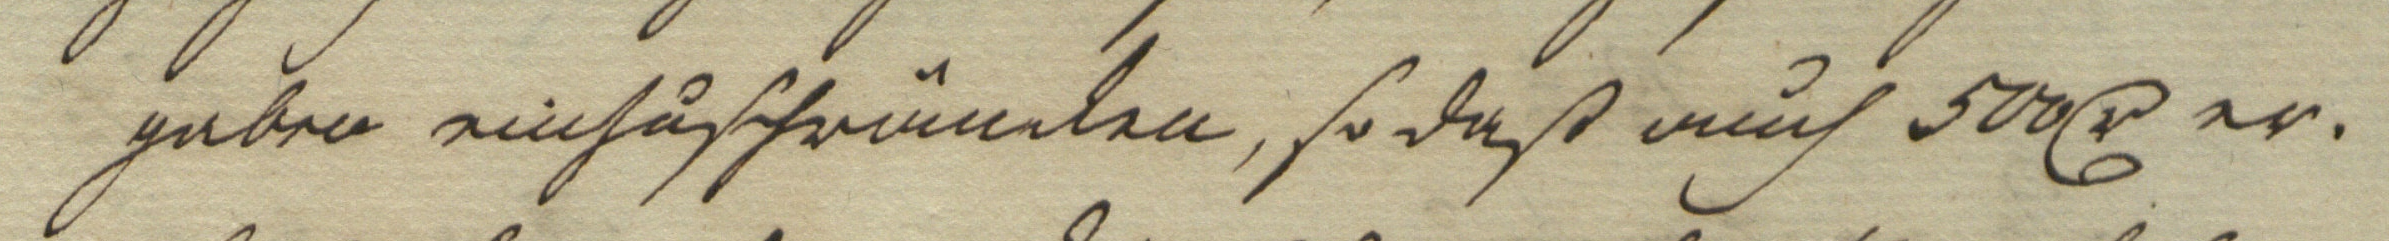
gaben einzuschränken, so daß auch 500 rtl. er¬
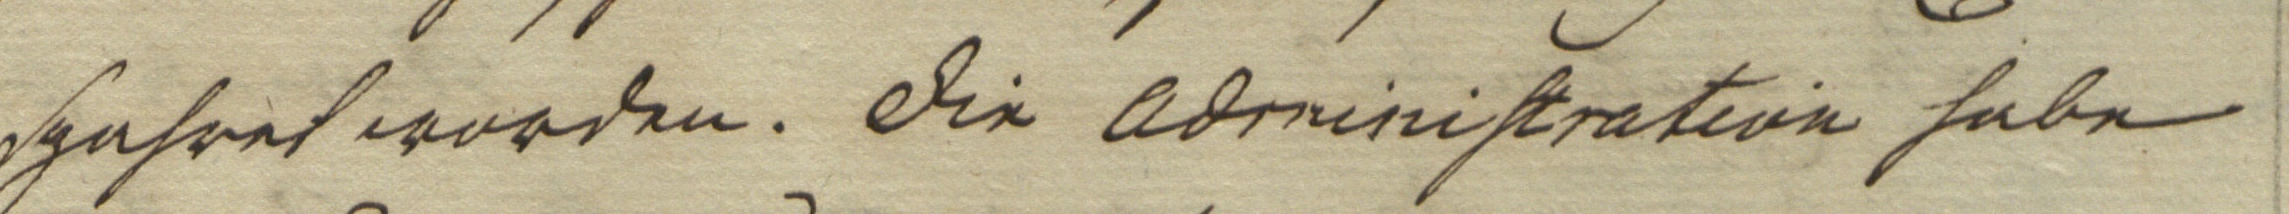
spahret worden. Die Administration habe
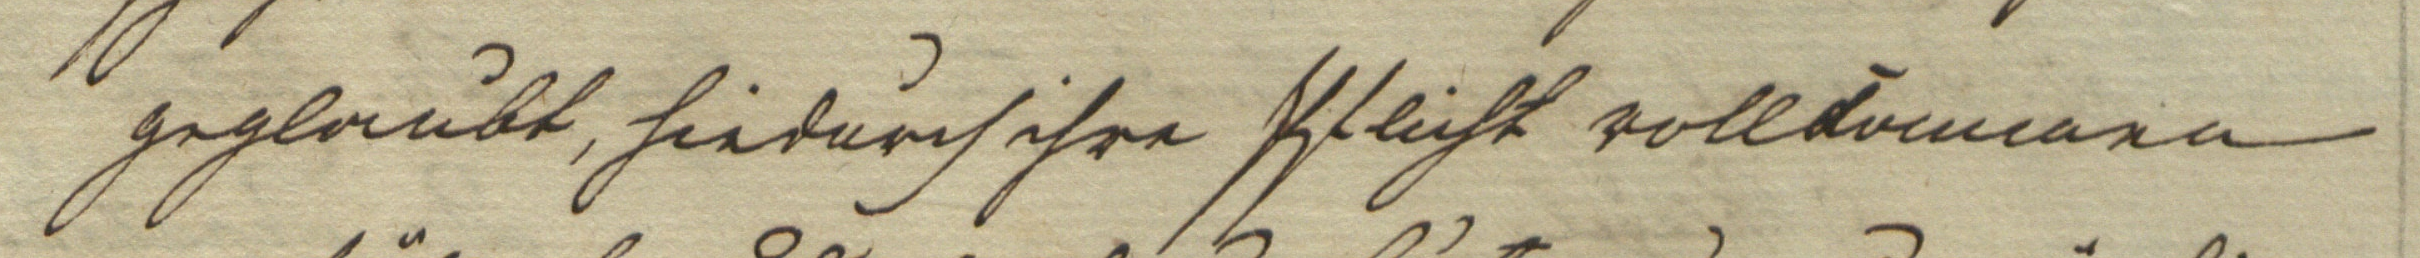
geglaubt, hiedurch ihre Pflicht vollkommen
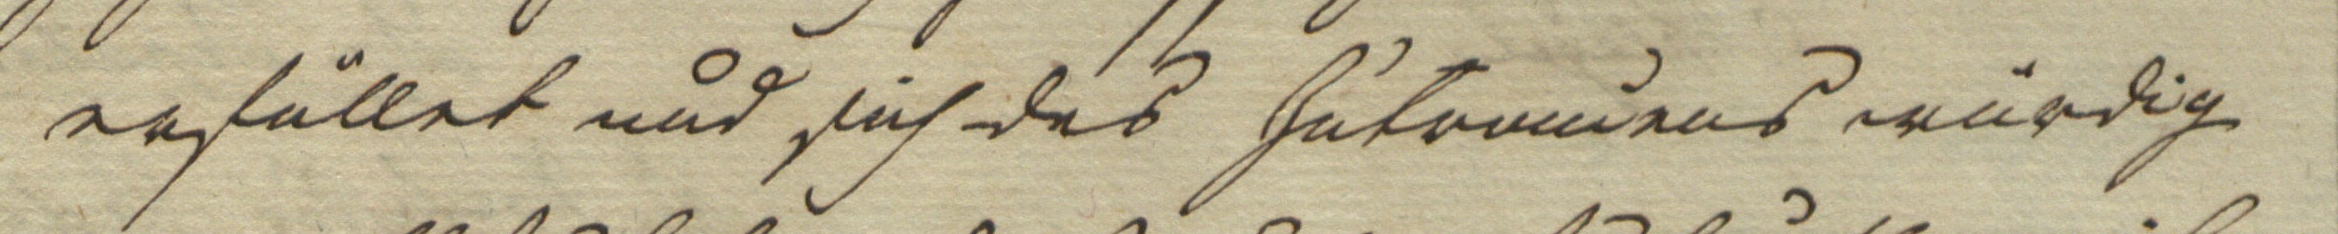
erfüllet und sich des Zutrauens würdig
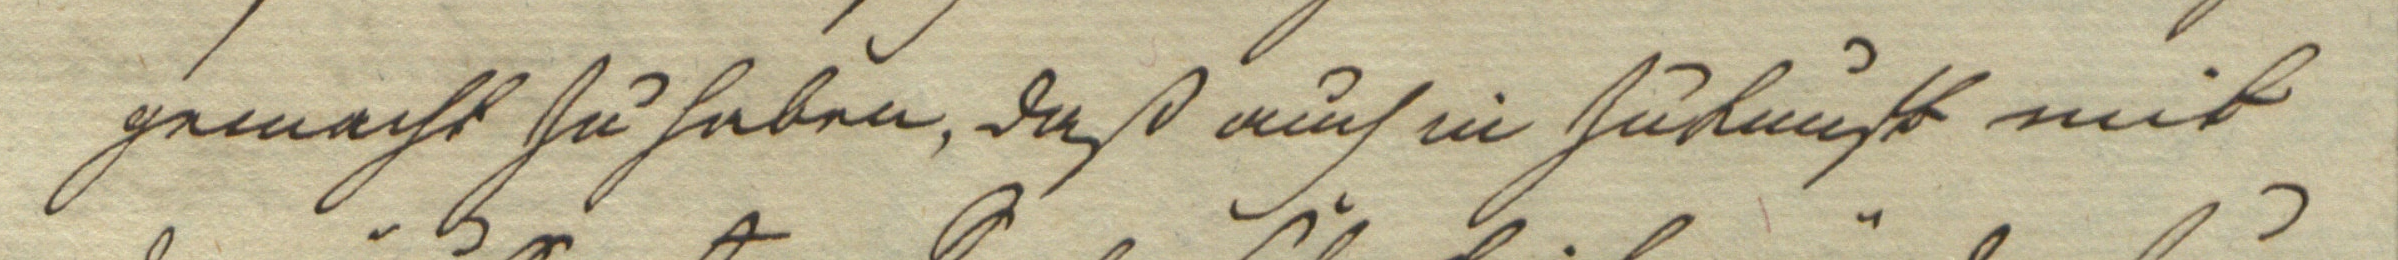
gemacht zu haben, daß auch in Zukunft mit
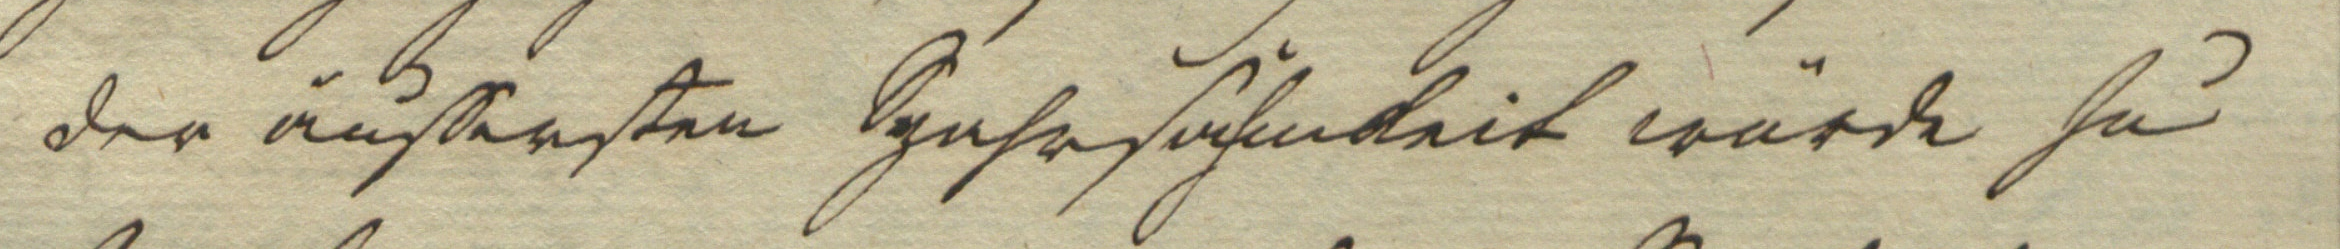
der äussersten Spahrsahmkeit würde zu
